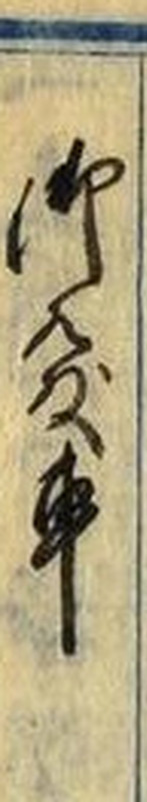御発車

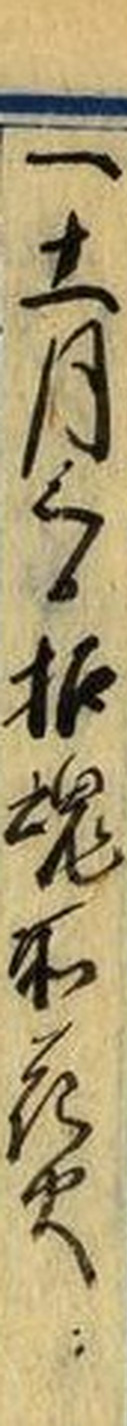一十一月三日招魂所花火
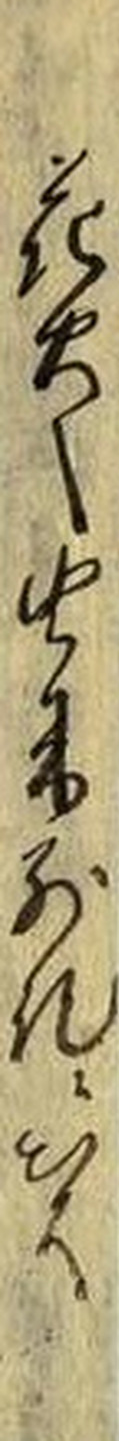花火之由来別記に出す
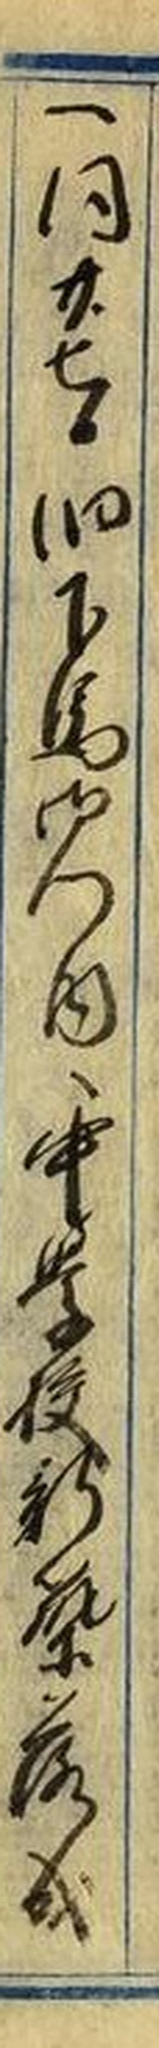一同廿七日旧下馬御門内へ中学校新築落成
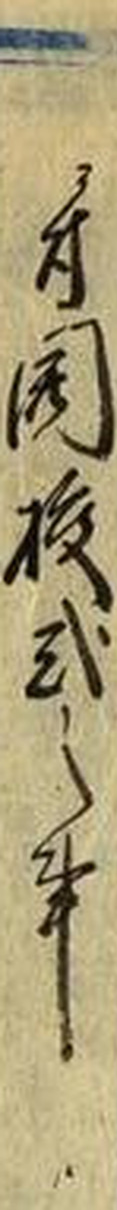に付開校式之事
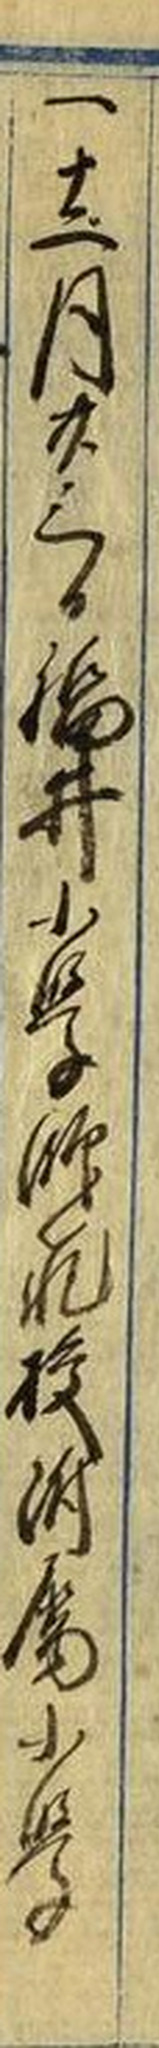一十二月廿三日福井小学師範校付属小学
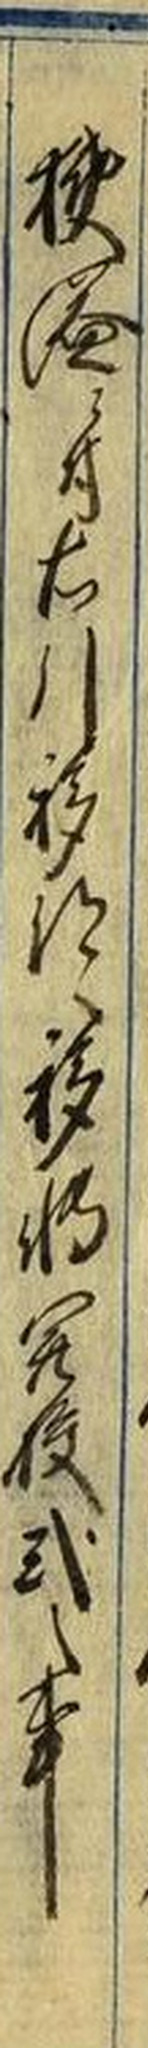狭隘に付右引移跡へ移転開校式之事
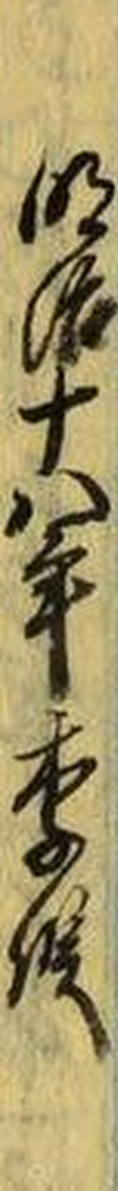明治十八年季候
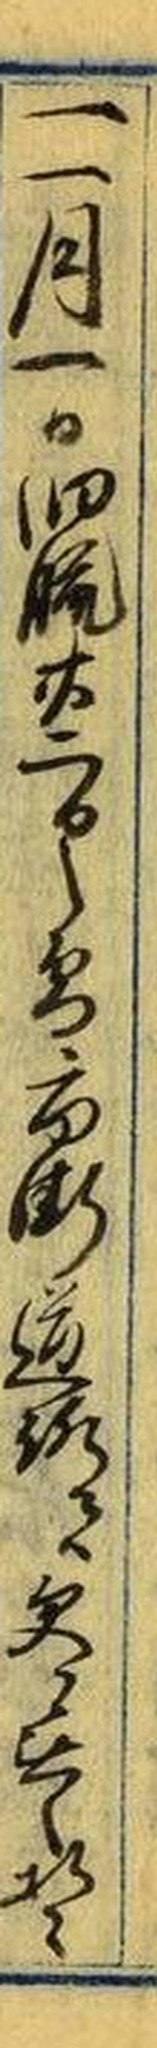一一月一日旧臘廿二日之雪市街道路には更に無之折々
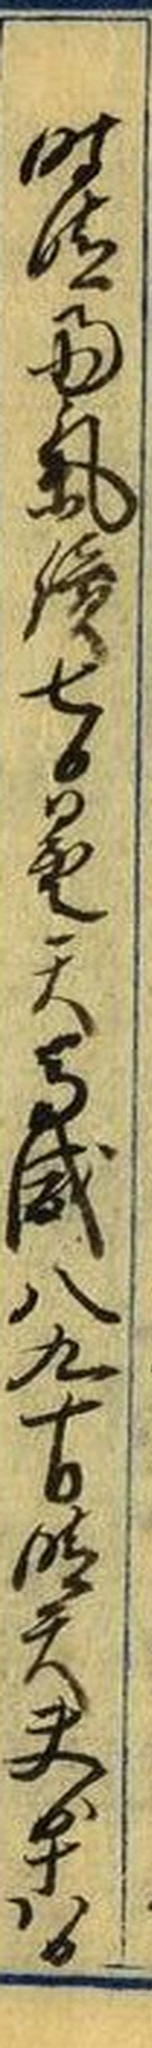時晴雨気続七日曇天高咸八九十日晴天夫ゟ十八日
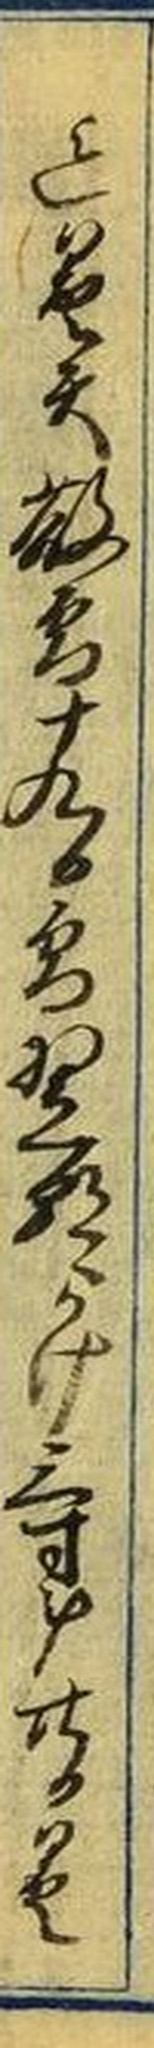迄曇天散雪十九日雪翌朝にかけ三寸計廿日曇
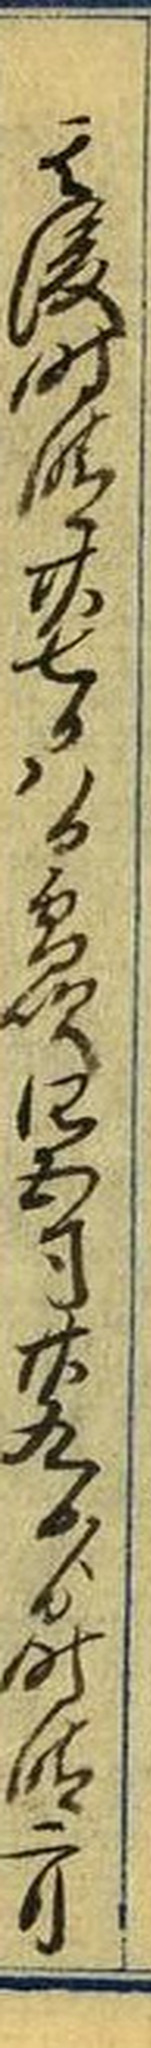其後時晴廿七日八日雪吹四五寸廿九日ゟ時晴二月
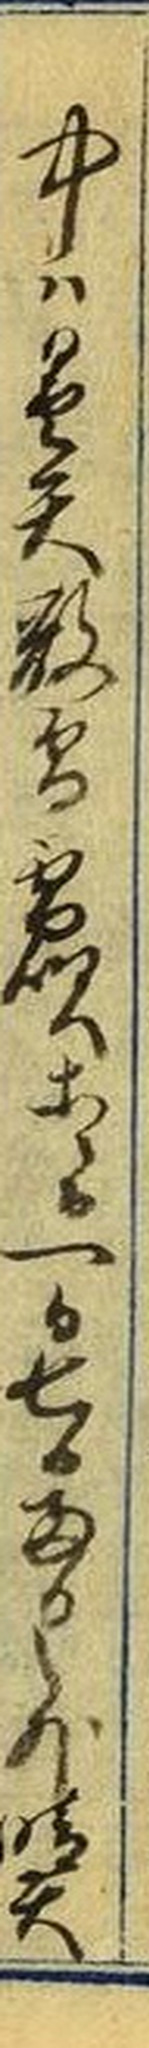中は曇天散雪雪吹等に而一日七日両日之外晴天
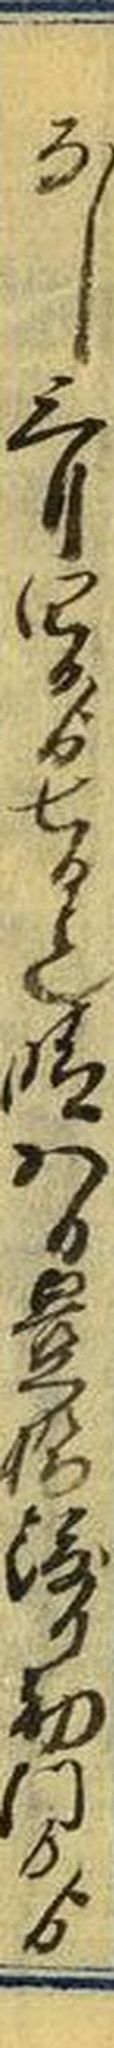なし三月四日ゟ七日迄晴八日豊橋渡り初門方ゟ
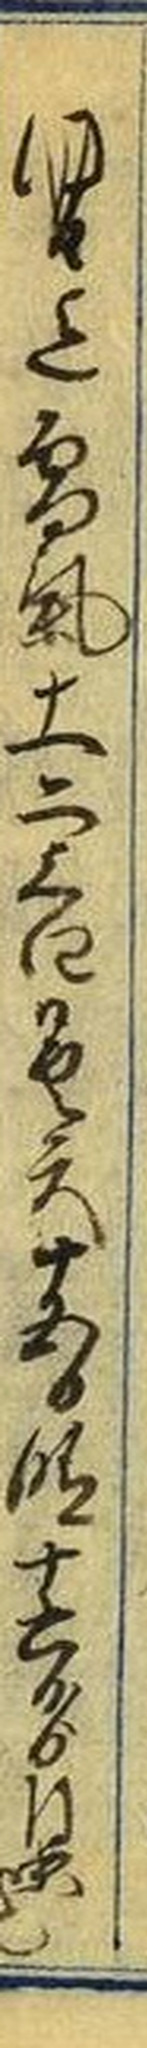門方迄雪気十一二三四曇天十五日晴十六日ゟ月末迄
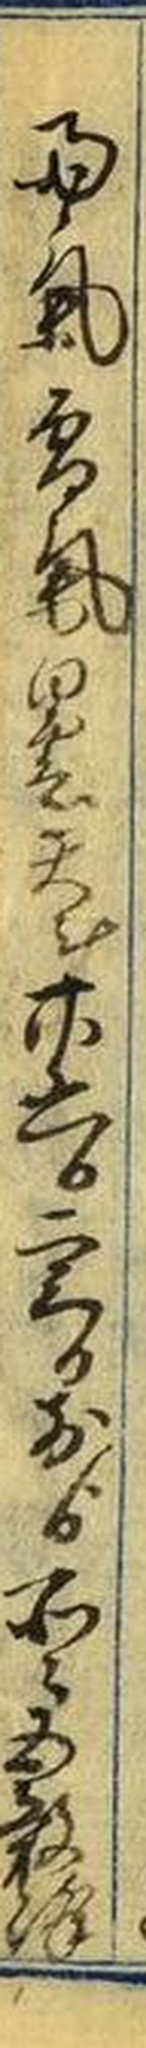雨気雪気曇天計廿六日二三日前ゟ所々五穀降
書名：温古集 五巻
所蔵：福井県文書館 Fukui Prefectural Archives
